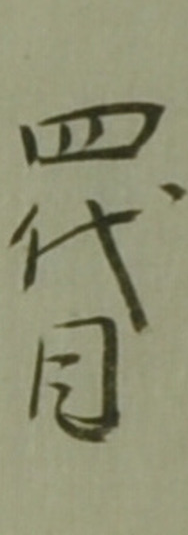四代目
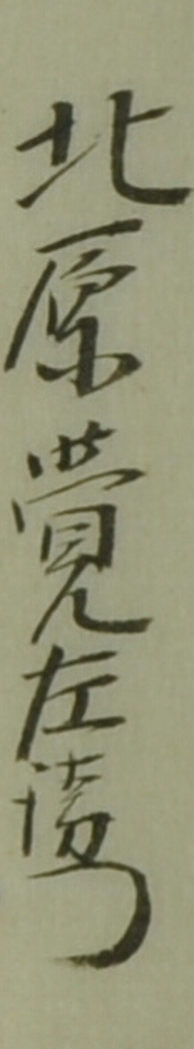北原覚左衛門

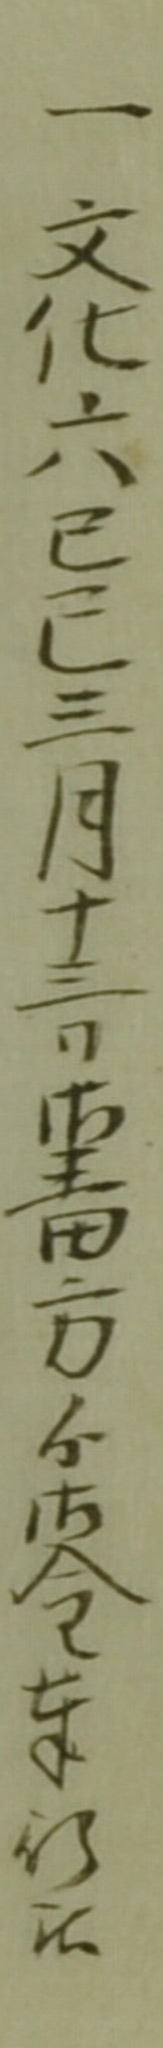一文化六己巳三月十三日御番方ゟ御金奉行被
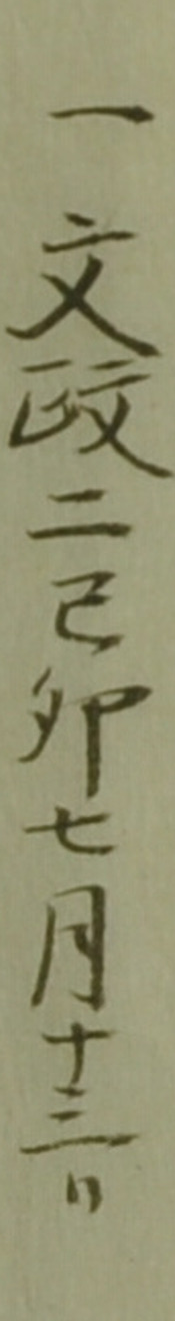一文政二己卯七月十三日
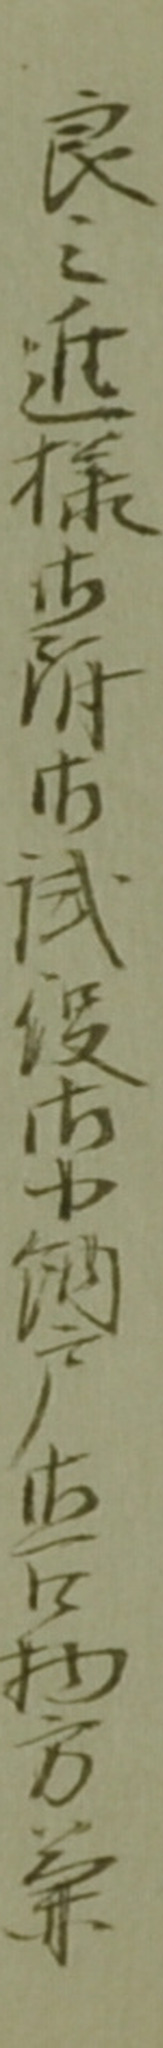良之進様御附御試役御小納戸御召物方兼
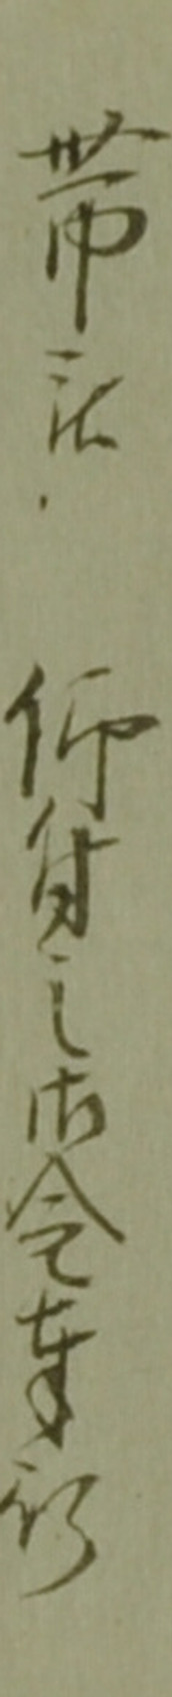帯被仰付之御金奉行
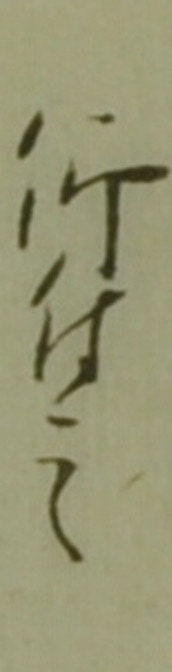仰付之
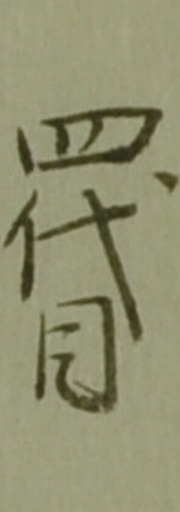四代目
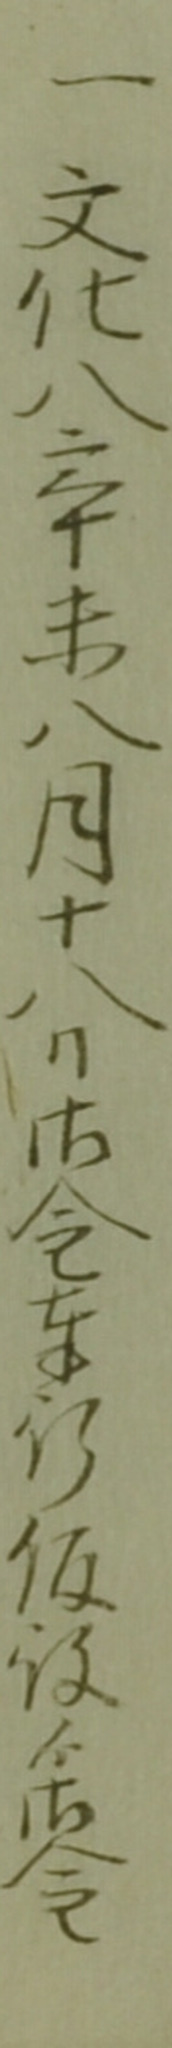一文化八辛未八月十八日御金奉行仮役ゟ御金
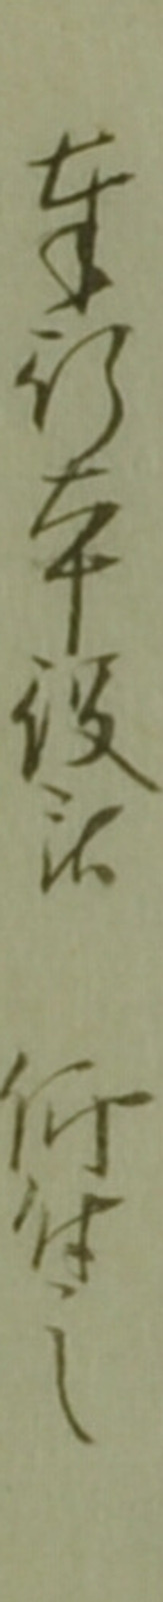奉行本役被仰付之
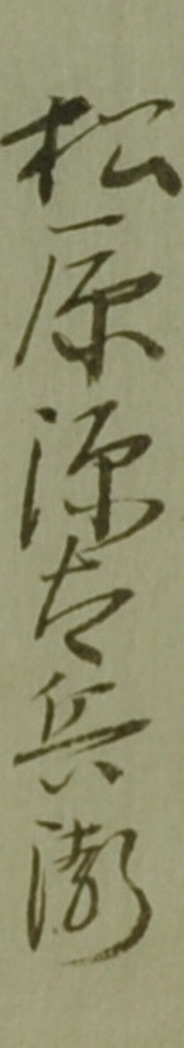松原源太兵衛
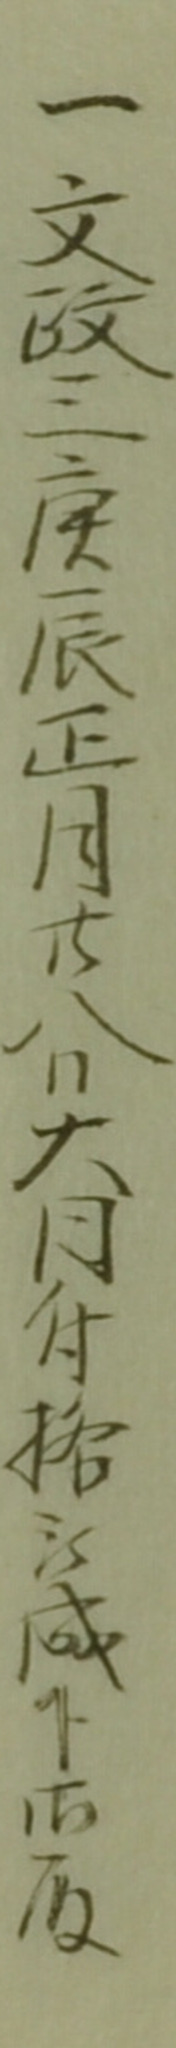一文政三庚辰正月廿八日大目付格被成下御取
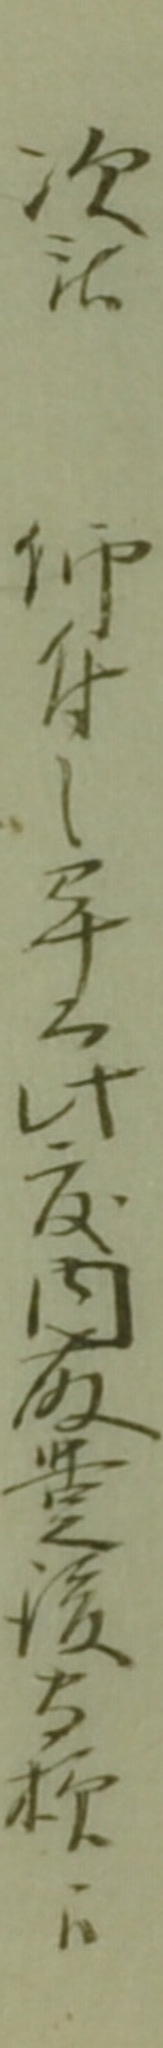次被仰付之畢而此度内藤豊後守様被
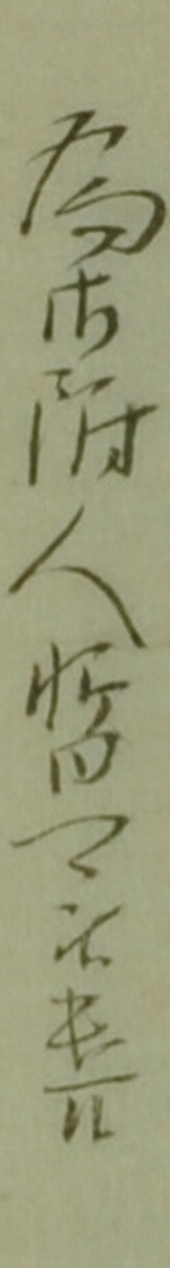為御附人暫可被遣候
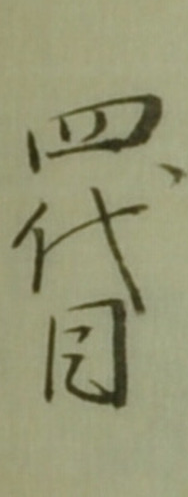四代目
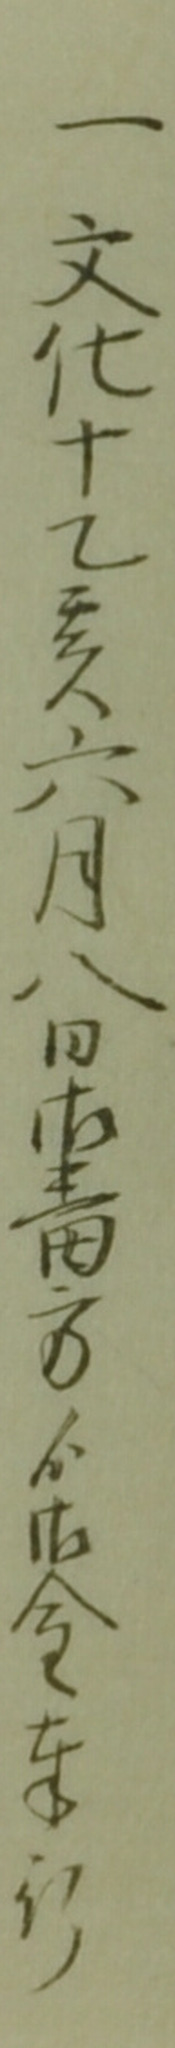一文化十乙亥六月八日御番方ゟ御金奉行
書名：諸御役代々録（七）
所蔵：伊那市立高遠町図書館・合同会社AMANE
